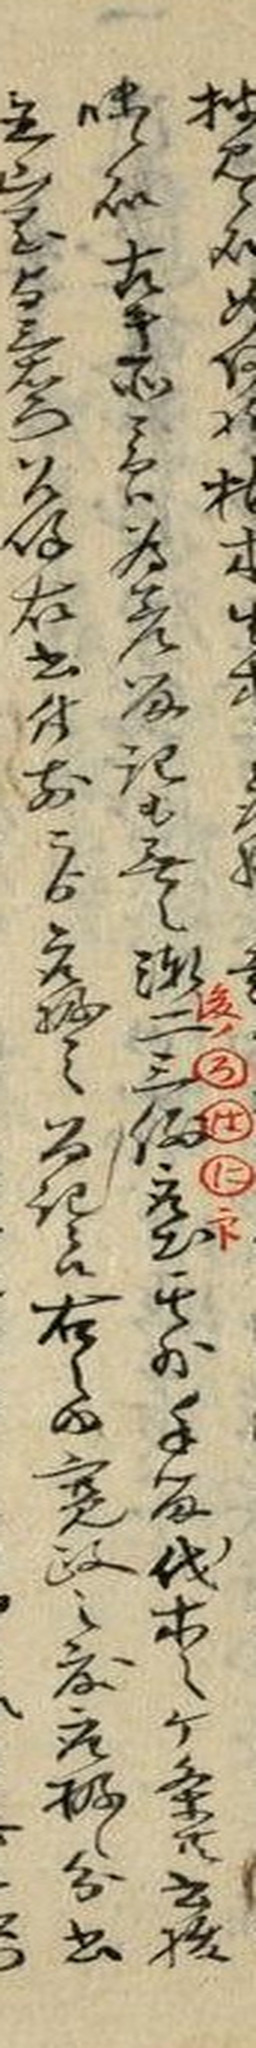置山岡与三右衛門召呼右書付前々ゟ取扱之留記に候右之内寛政之度取扱候分書
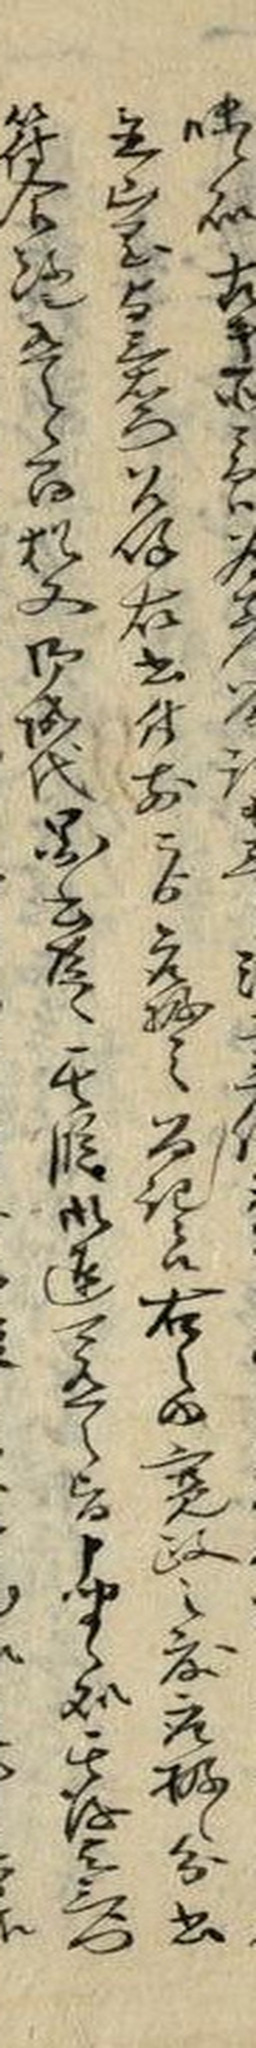符合致シ有之候間猶又御城代図書殿へ其段御達可有之旨申聞候処其後与三右衛門
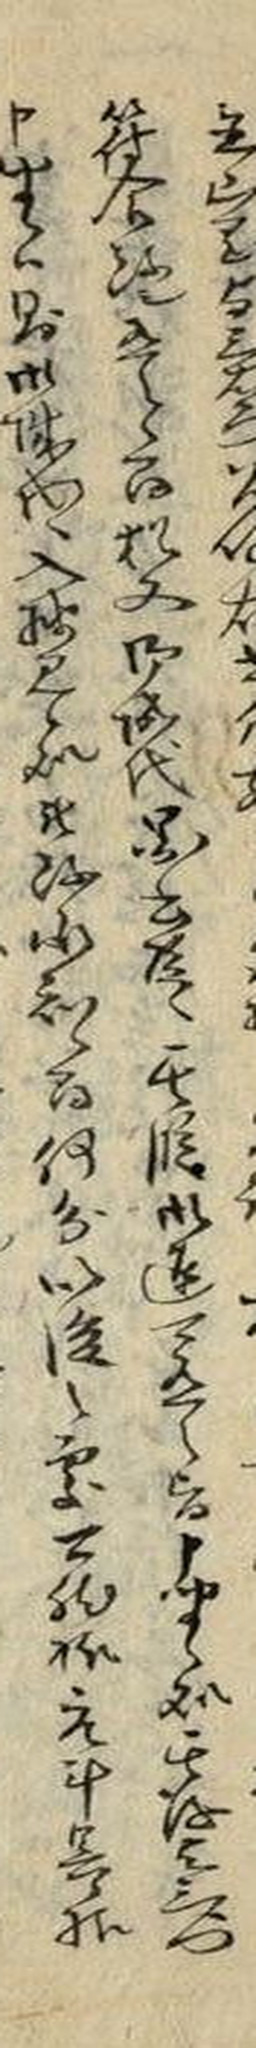申聞候は則御城代へ入披見候処被致承知候間何分以後之処可然様取斗呉候様
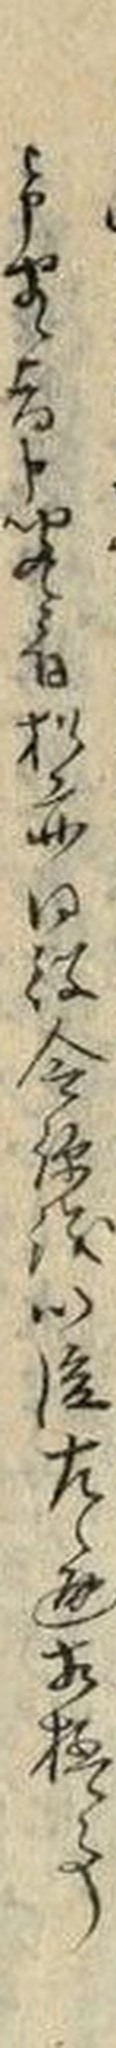被申聞候旨申聞候に付猶亦同役令評議以後左之通相極候事
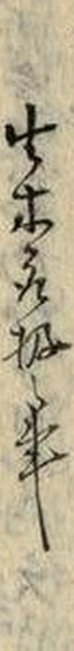生木取扱之事
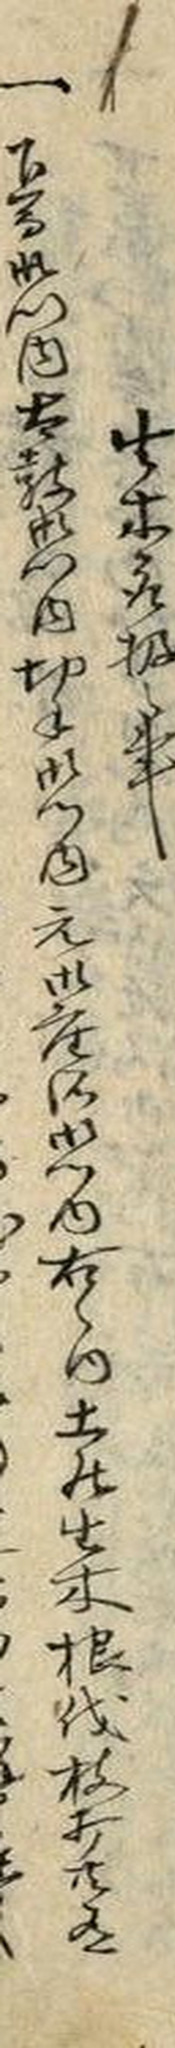一下馬御門内太皷御門内切手御門内元御座所御門内右之内土居生木根伐枝打共有
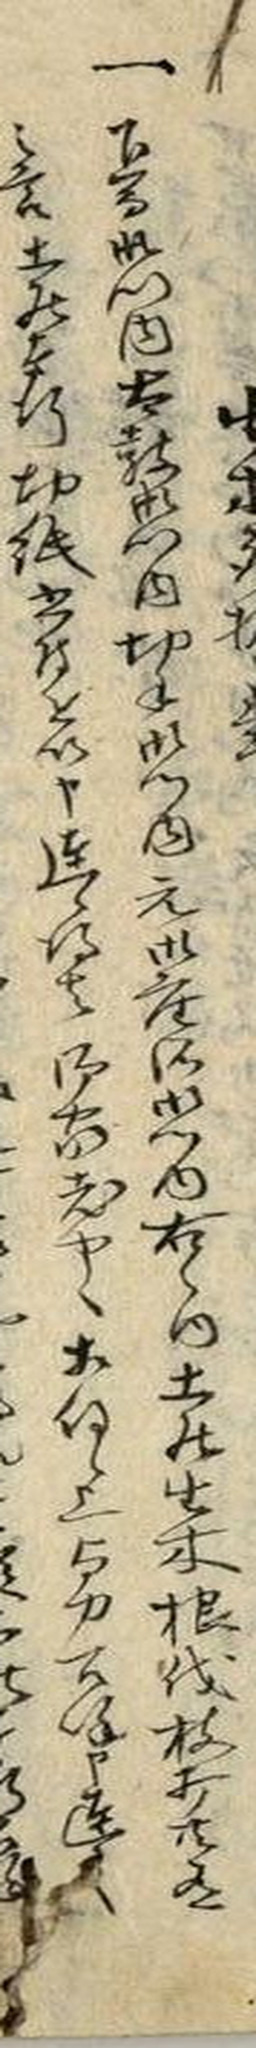之節土居奉行切紙書付を以申達候得は御家老中へ相伺候上与力召呼申達之
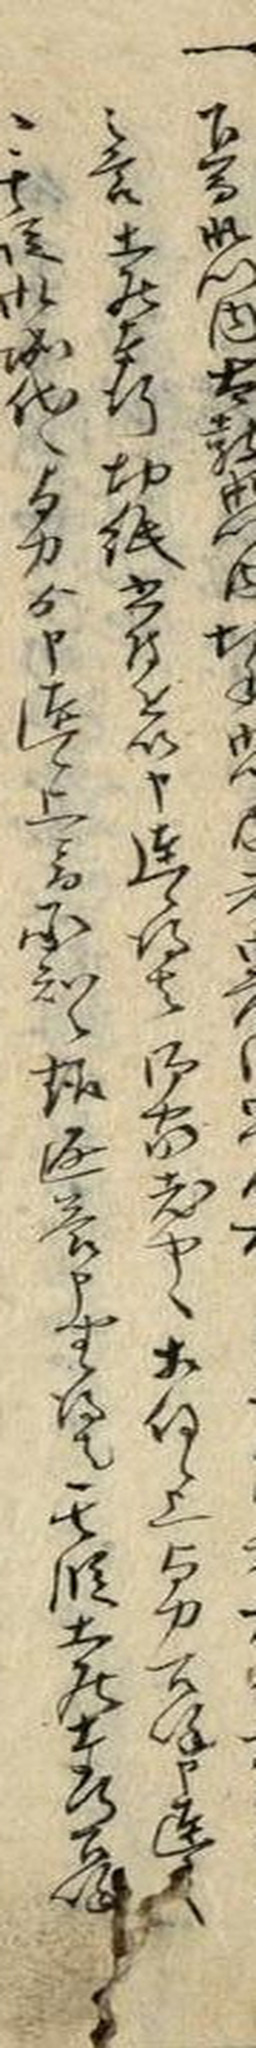候其段御城代へ与力ゟ申達候上にて承知候趣返答申聞候得は其段土居奉行召呼
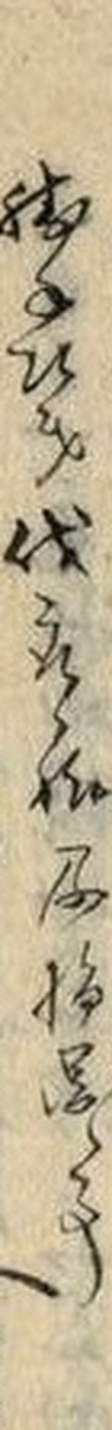勝手次第伐取候様及指図候事
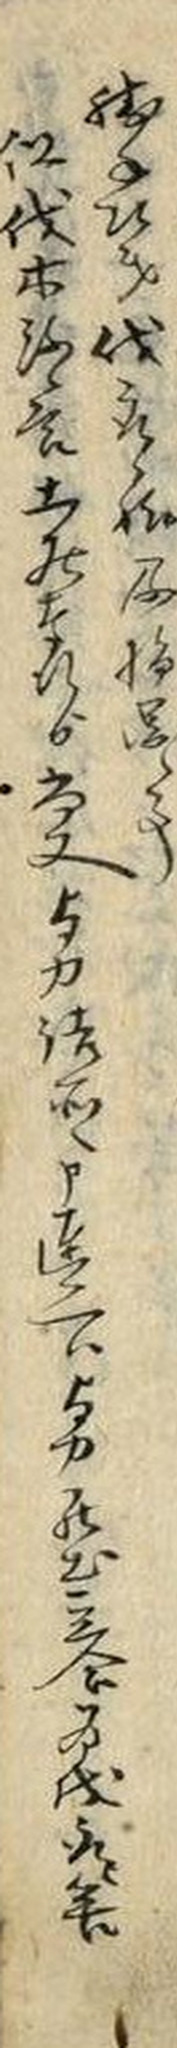但伐木致候節土居奉行ゟ尚又与力詰所へ申達候へは与力罷出立合為伐取候筈

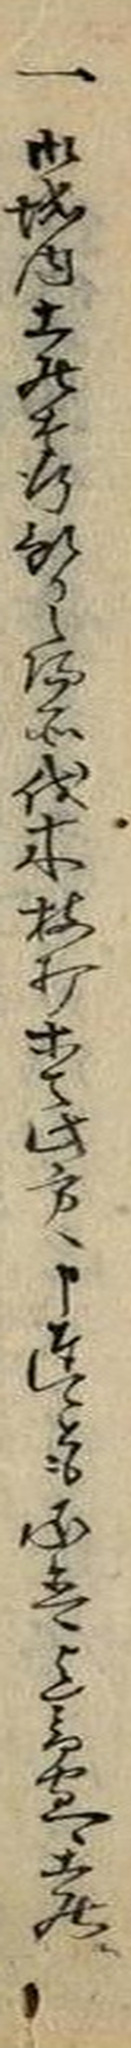一御城内土居奉行預り之場所伐木枝打等は此方へ申達候とも承置候迄にて宜候土居
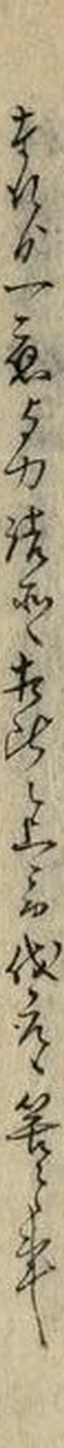奉行ゟ一応与力詰所へ相断候上にて伐取候筈に候事
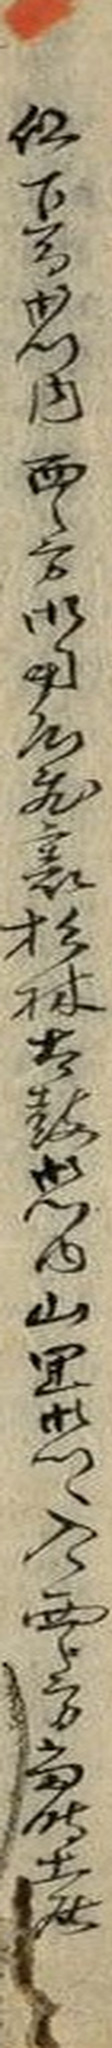但下馬御門内西之方御用屋敷裏杉林太皷御門内山里御門へ入候西之方当時土居
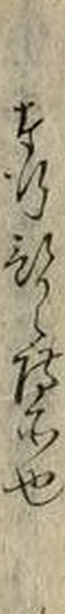奉行預り之場所也
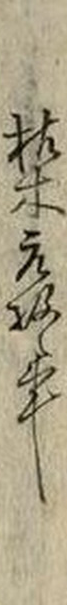枯木取扱之事
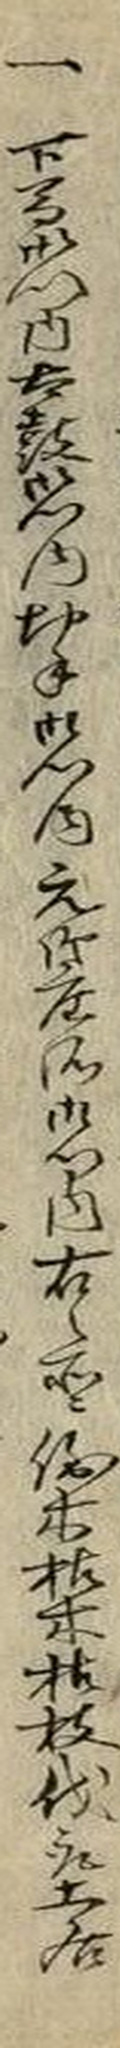一下馬御門内太皷御門内切手御門内元御座所御門内右之所に倒木枯木枯枝伐取土居
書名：御城下諸事之部
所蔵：福井県文書館 Fukui Prefectural Archives
